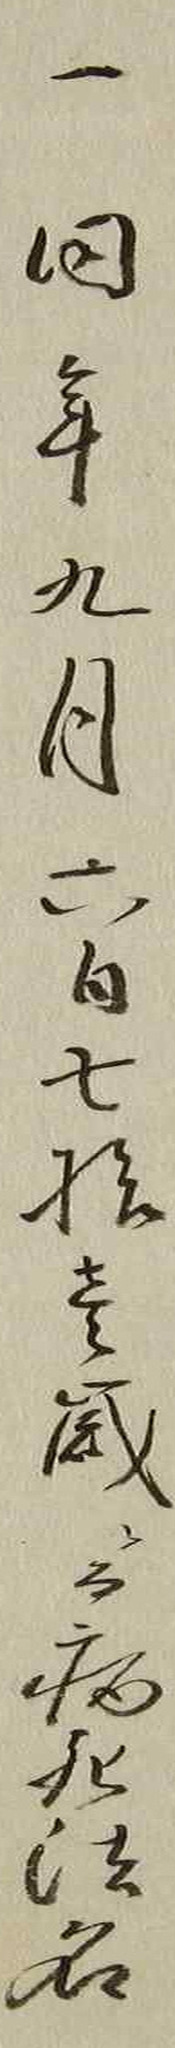一同年九月六日七拾壱歳ニ而病死法名
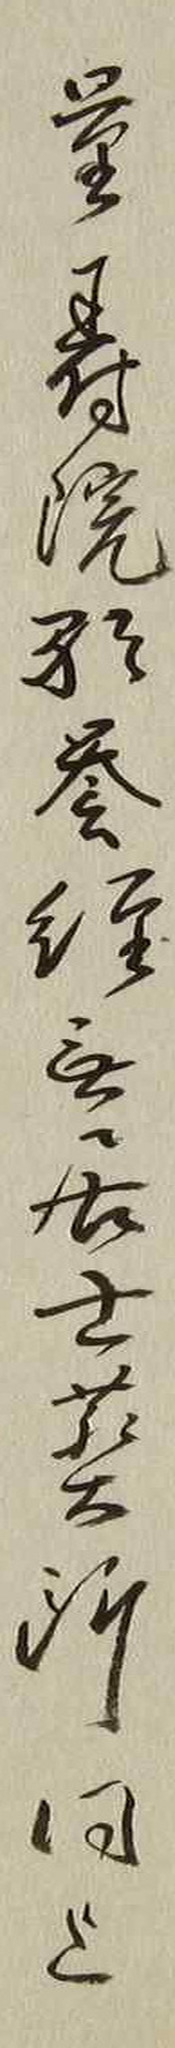量寿院顕誉経無居士葬所同上
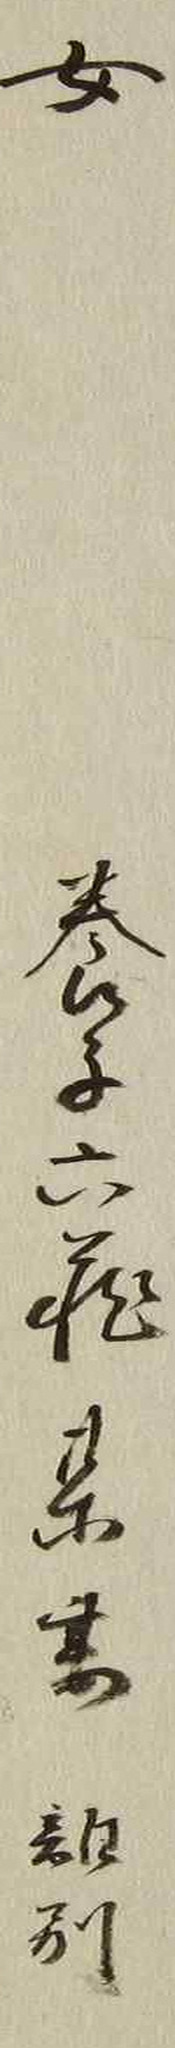女養子六蔵其妻離別
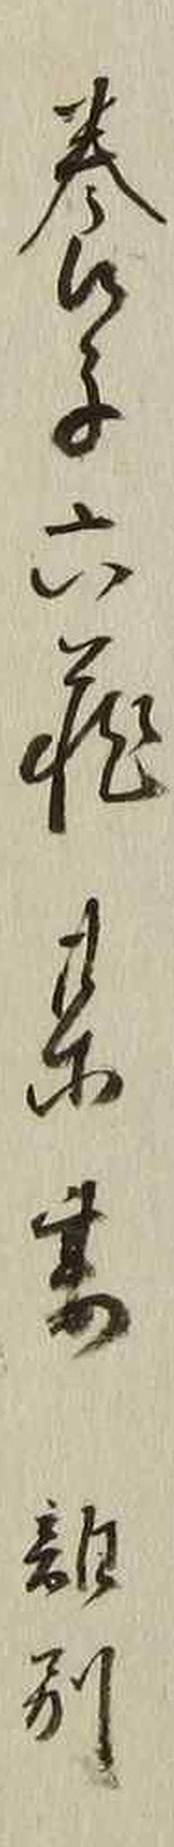女養子六蔵其妻離別
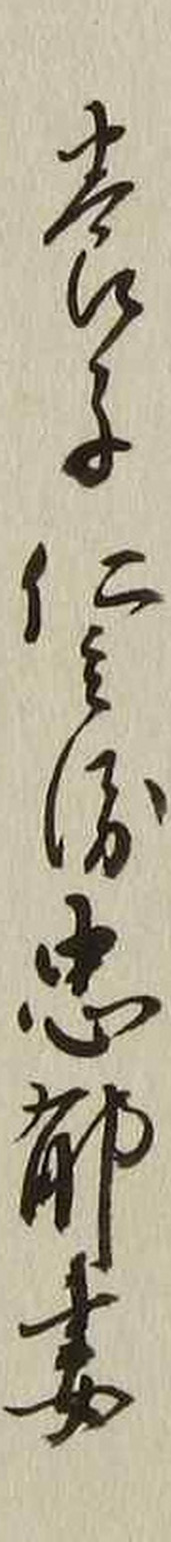養子仁兵衛忠郁妻
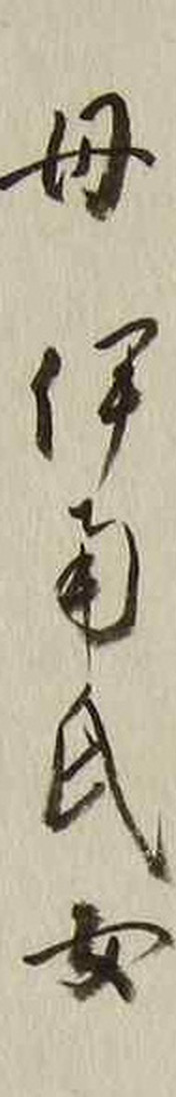母伊南氏女
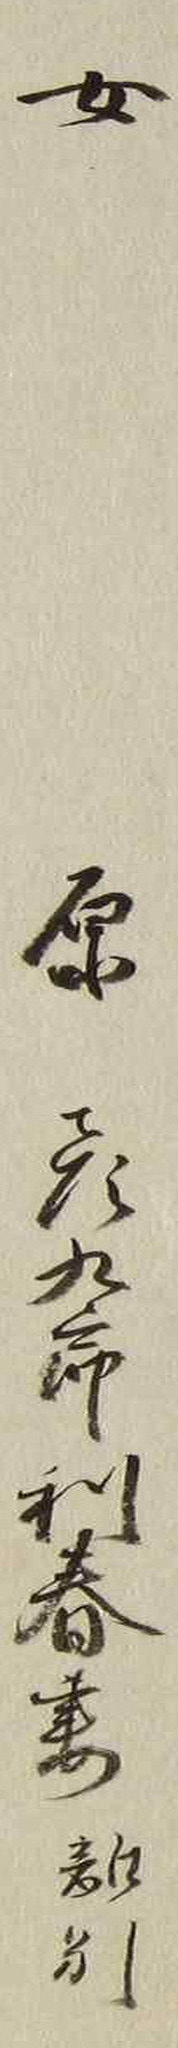女原彦九郎利春妻顔別
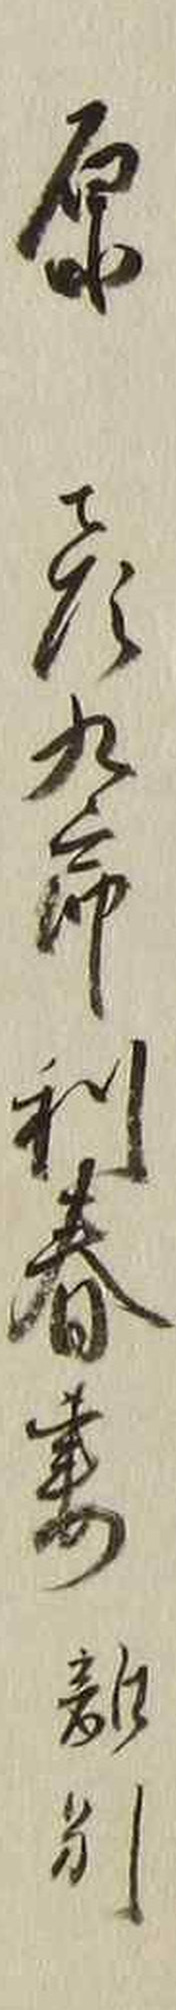女原彦九郎利春妻顔別
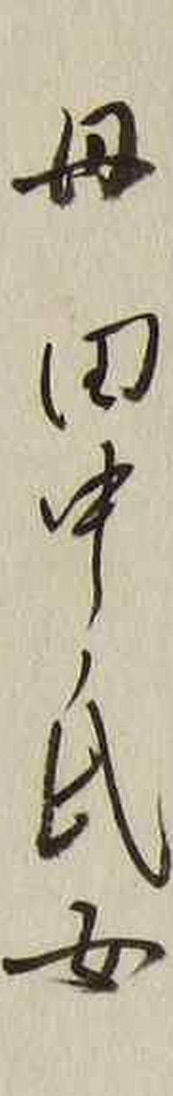母田中氏女

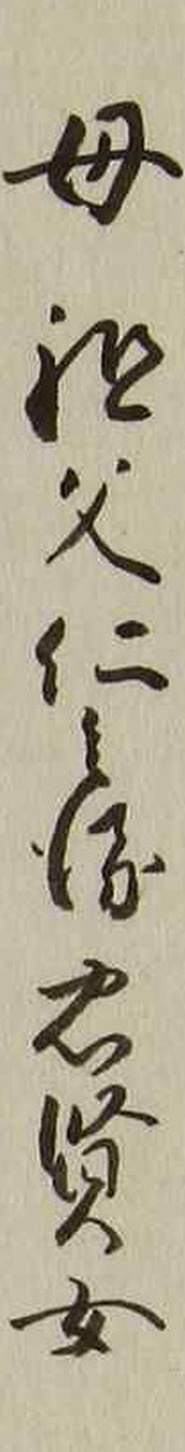母祖父仁兵衛忠賢女
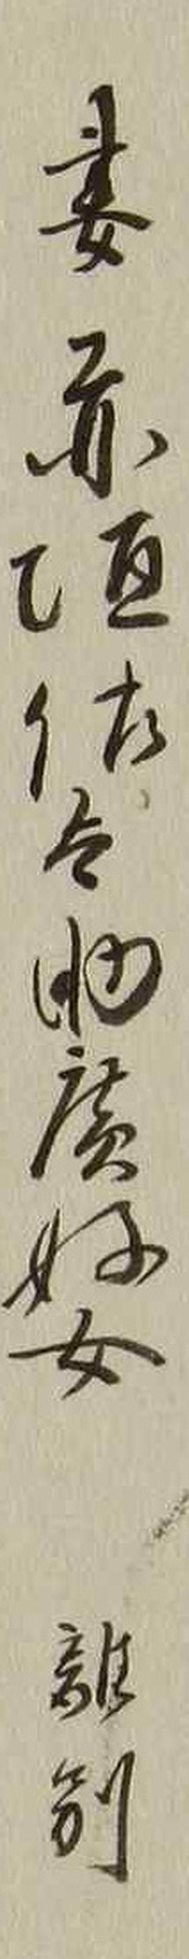妻赤垣佐太助広好女離別
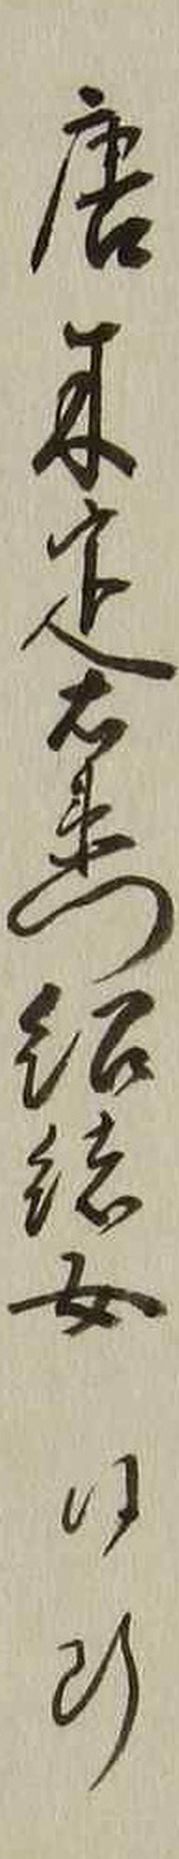唐木定右衛門紹緖女同断
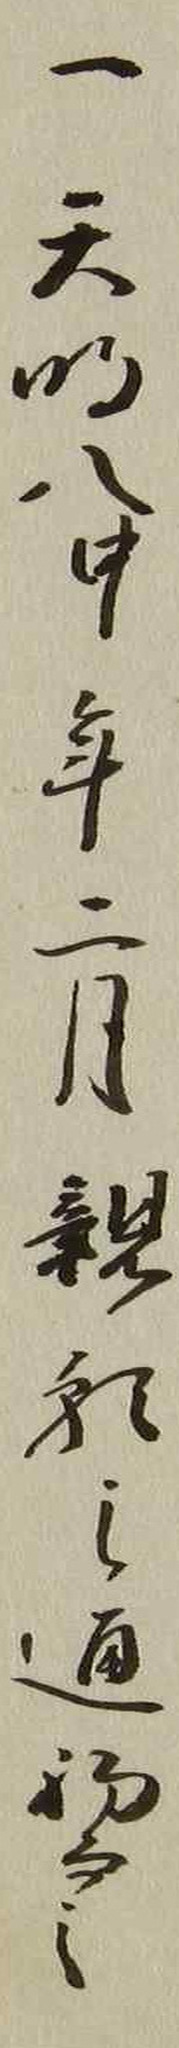一天明八申年二月親願之通初而之
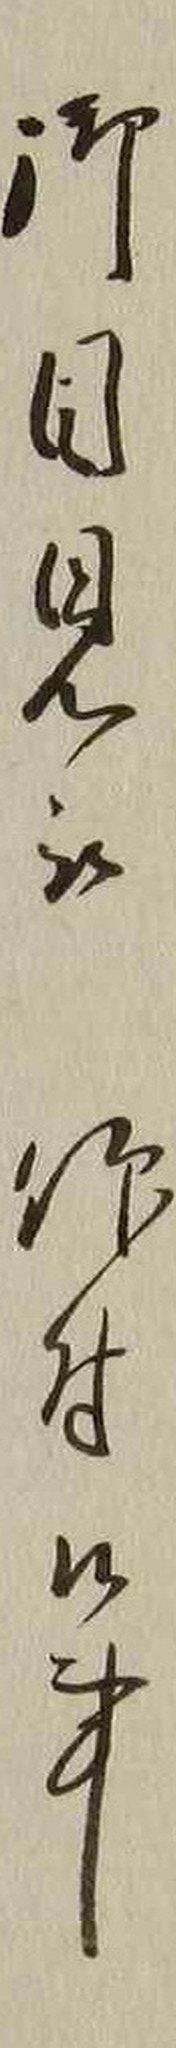御目見被仰付候事
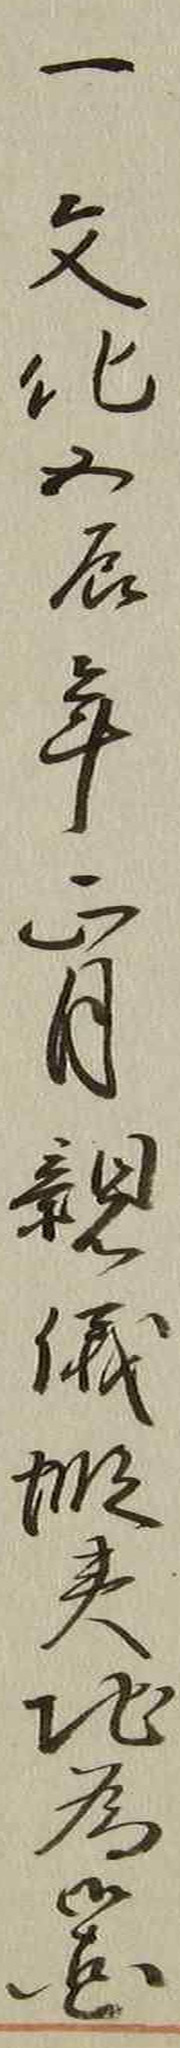一文化五辰年正月親儀蝦夷地為御固
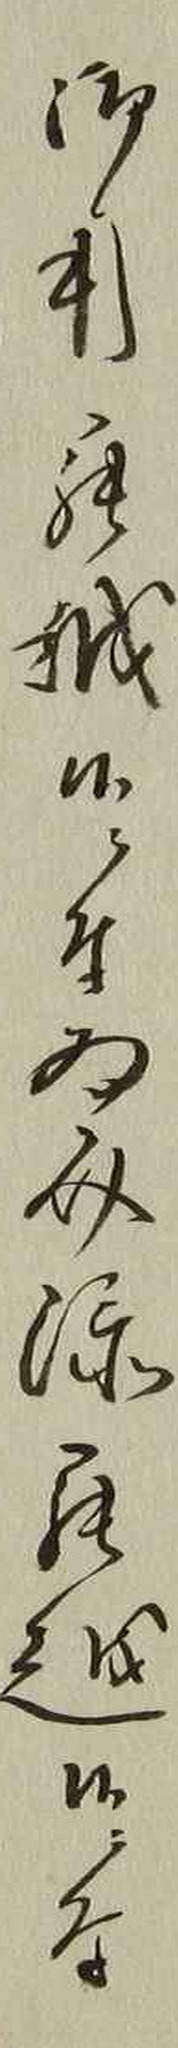御用罷越候ニ付為介添罷越候ニ付
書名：諸士系譜　巻之122　よ之部5
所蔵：会津若松市立会津図書館
